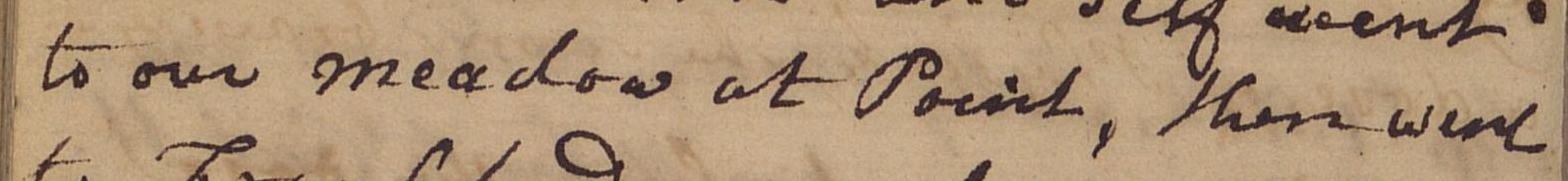to our meadow at Point, Them went
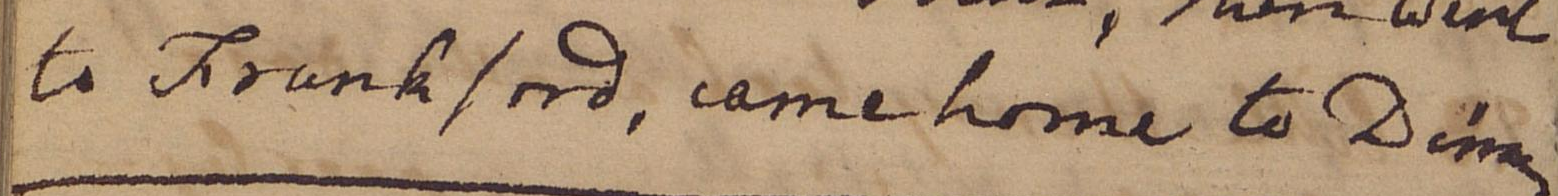to Frankford, came home to Dinnr
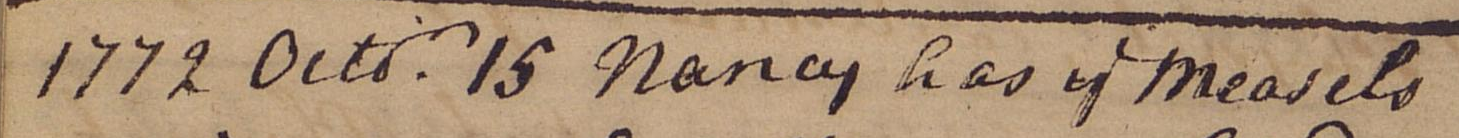1772 Octo^r. 15 Nancy has y^e Measels
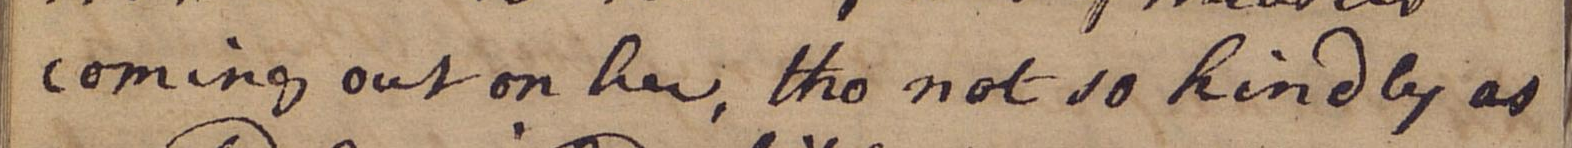coming out on her, tho not so kindly as
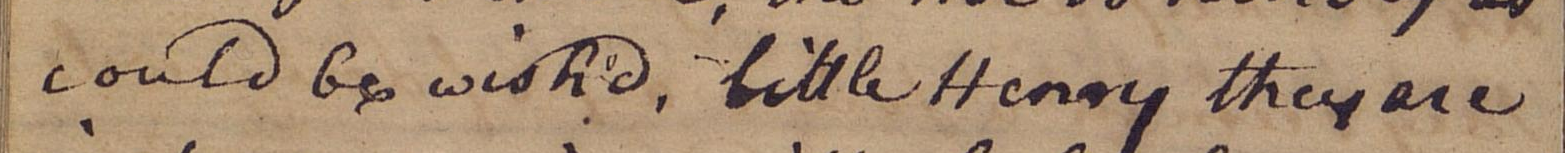could be wish'd, little Henry they are
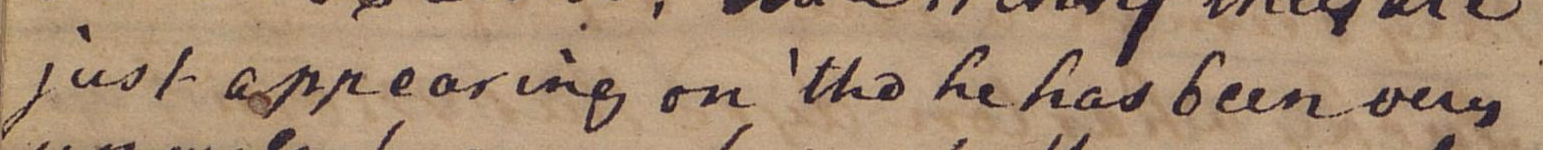just appearing on the 'tho he has been very
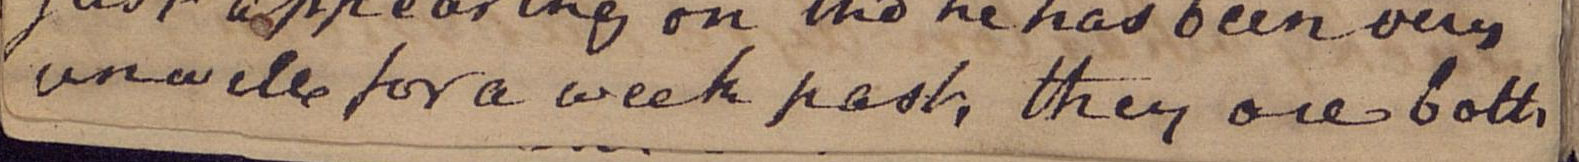unwell for a week past, they are both
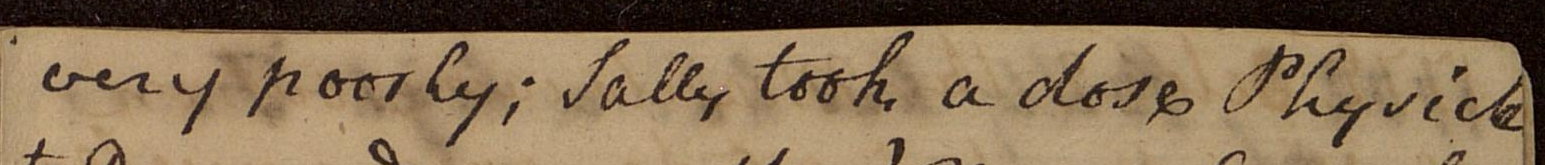very poorly; Sally took a dose Physick
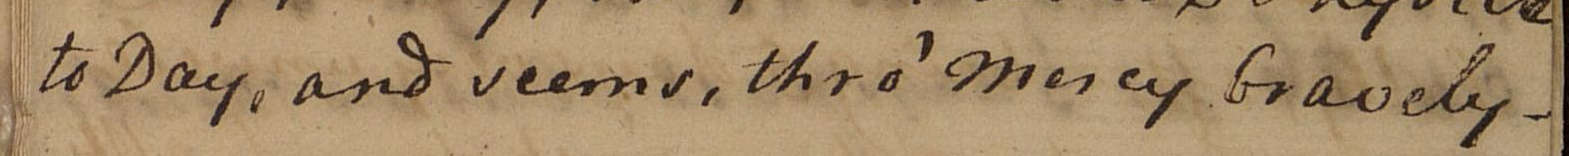to Day, and seems, thro' Mercy bravely-
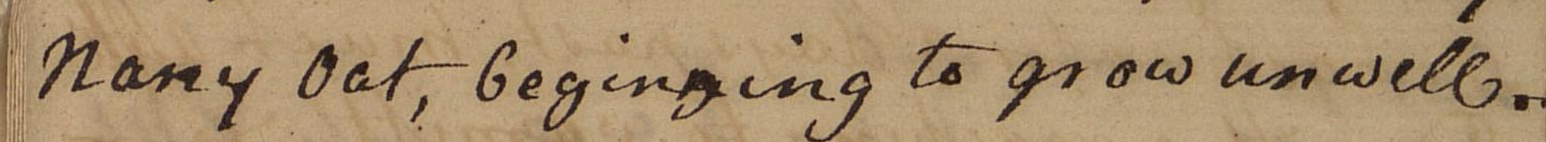Nany Oat, beginging to grow unwell.
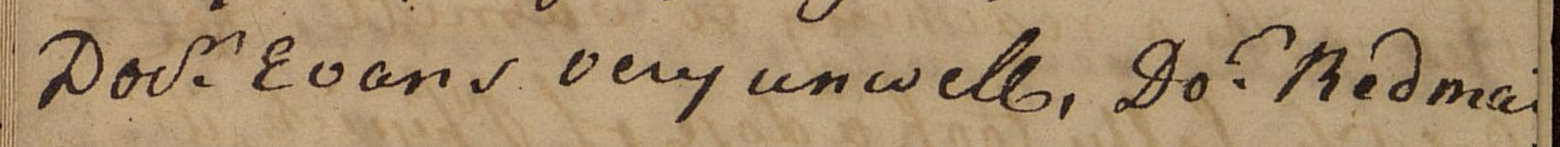Doc^r. Evans very unwell, Do^r- Redma
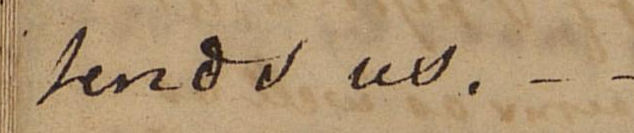tends us.-
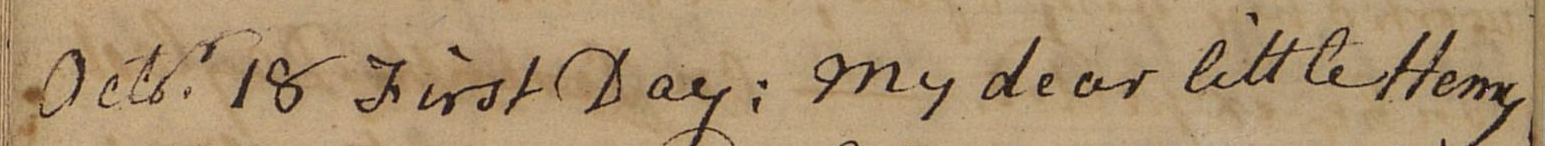Octo^r. 18 First Day: My dear little Henry
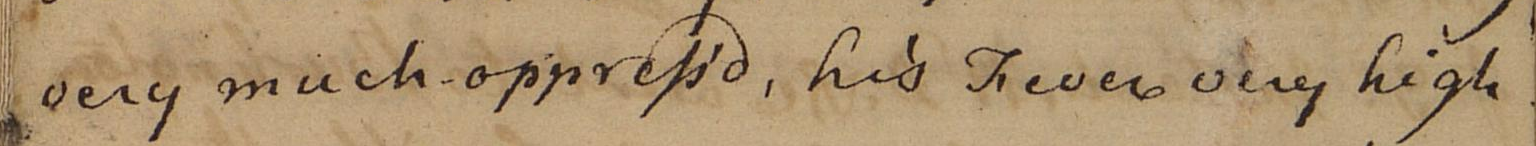very much oppress'd, his Fever very high
